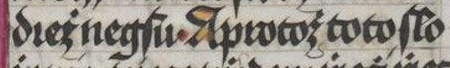dieżnegſu.Aprotoż toto ſlo¬
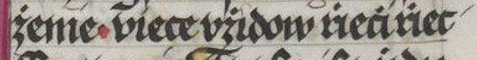żeníe.víece vżidow ṙieċí ṙiec¬
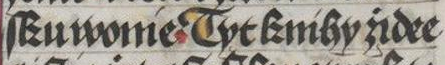ſku woníe.Tyt kníhy żidee
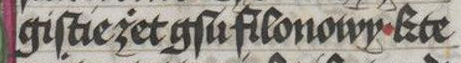giſtíe żet gſú filonowy.kte¬
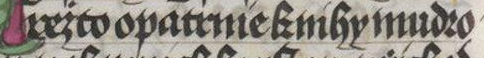reżto opatrníe kníhy mudro¬
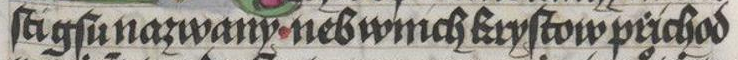ſtí gſu nazwany.neb w ních pṙíchod
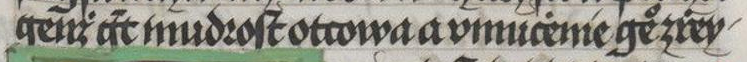genż ḡt mudroſt otcowa a vmuċeníe geo zṙey¬
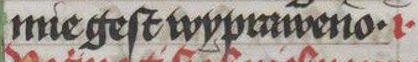mie geſt wypraweno.i.
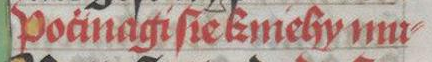Poċinagí ſie kniehy mu¬
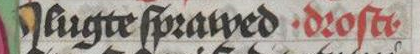Iſlugte ſprawed. droſti.
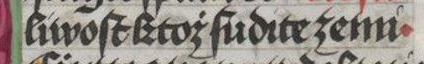líwoſt ktoż ſu dite zemi.
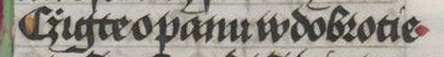Cżigte o panu w dobrotie.
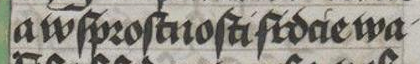a w ſproſtnoſti ſrdcie wa¬
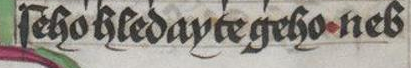ẛeho hledayte geho.neb
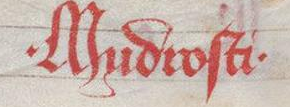.Mudroſtí.
